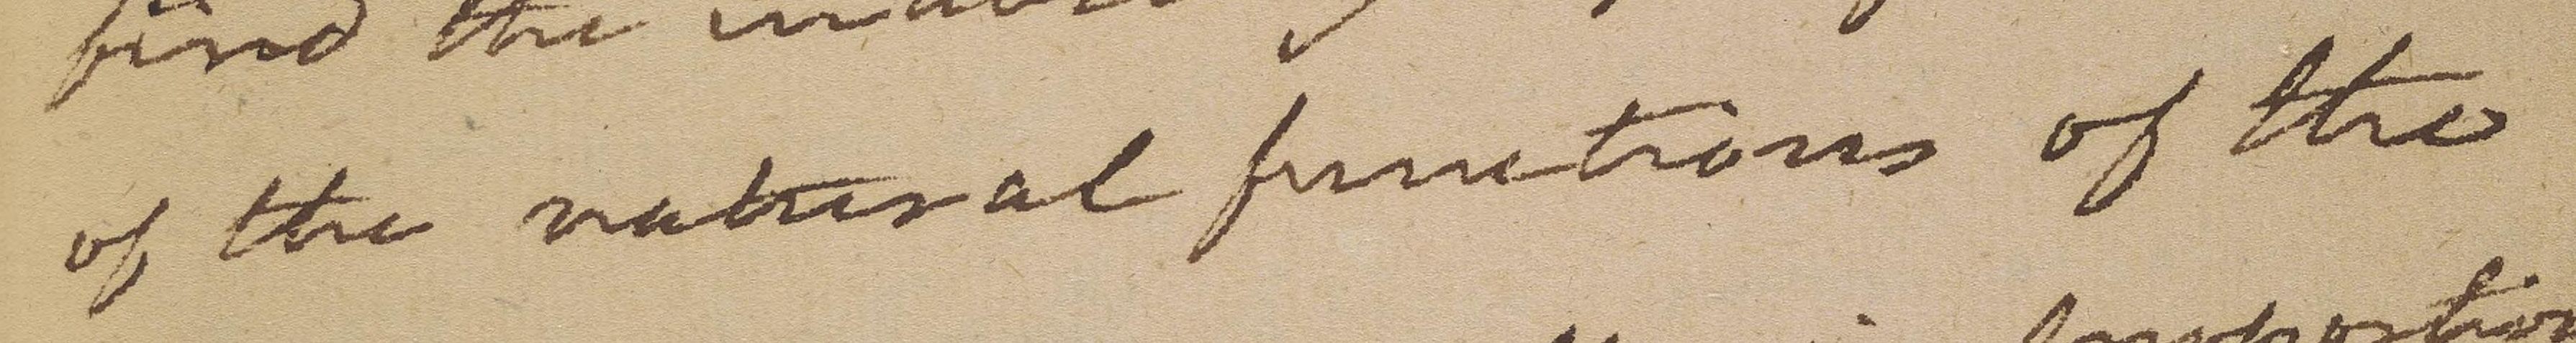of the natural functions of the
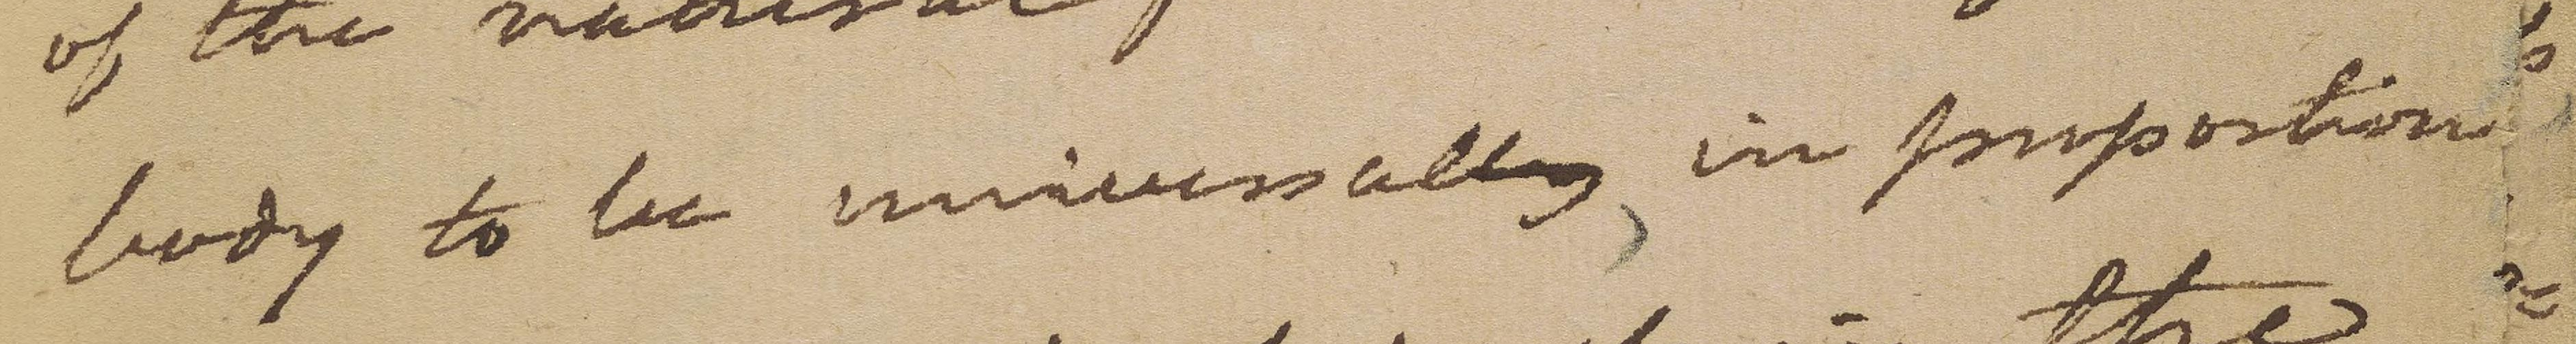body to be universally in proportion
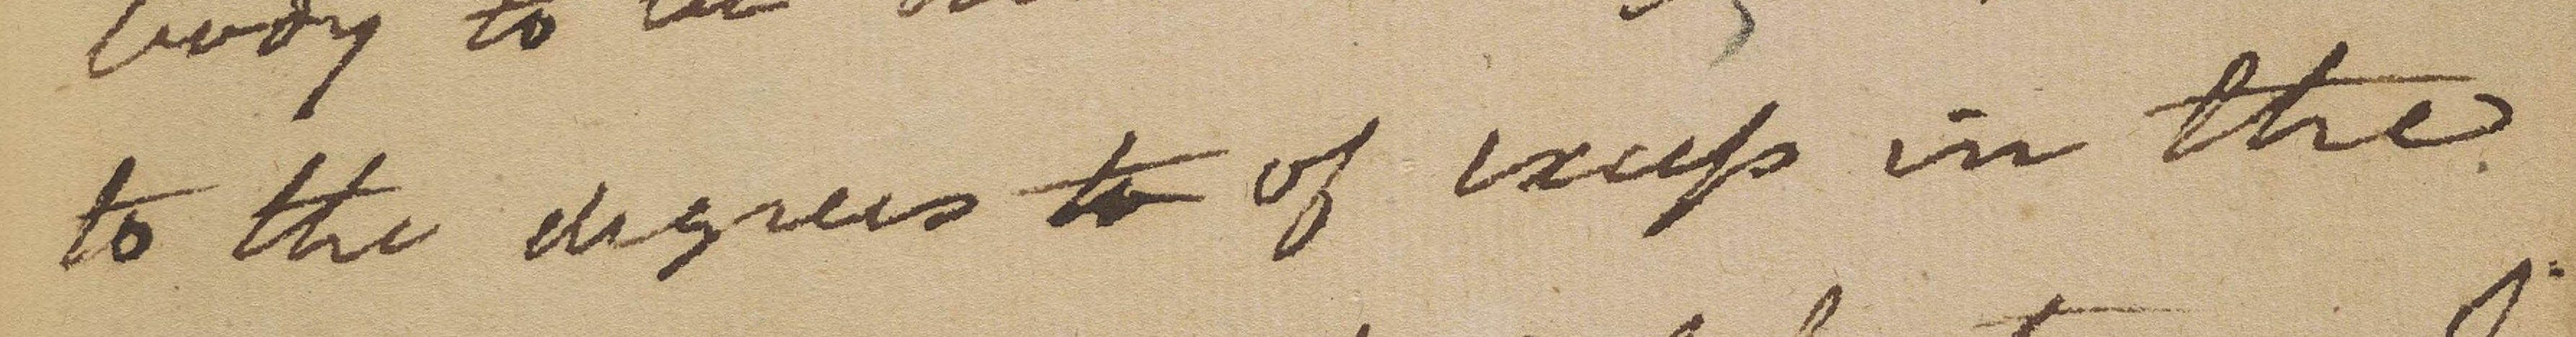to the degrees of excess in the
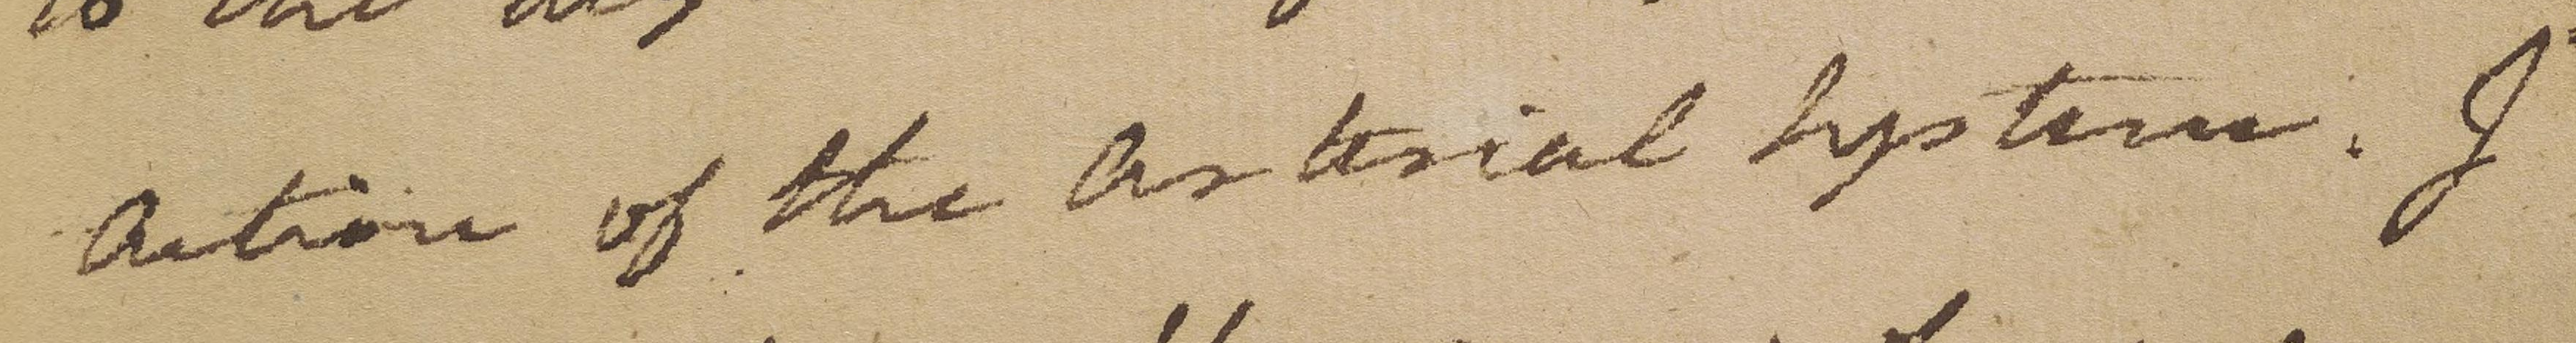action of the arterial system. I
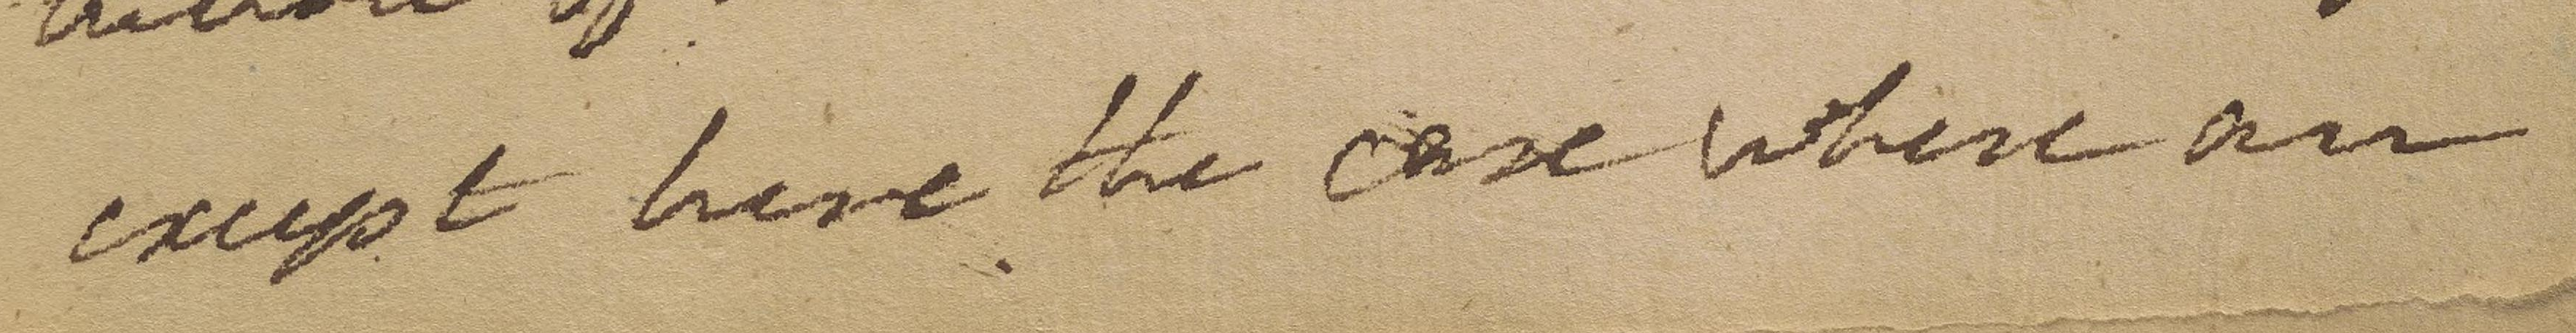except here the case where an
